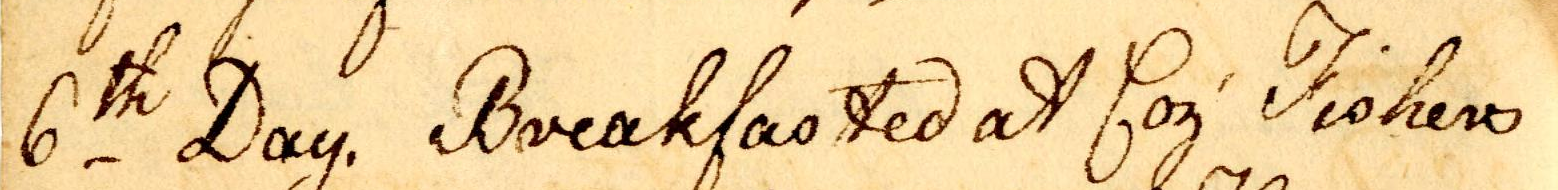6^th Day, Breakfasted at Coz Fishers
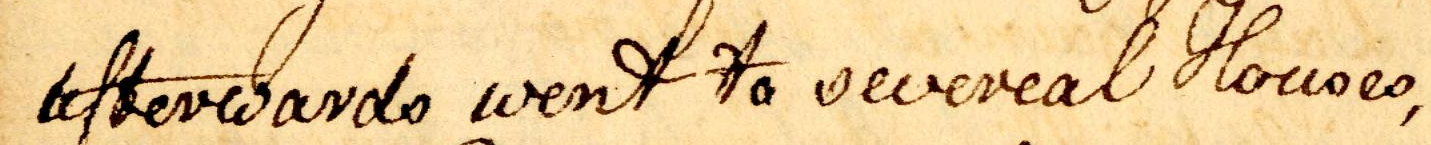afterwards went to several Houses,
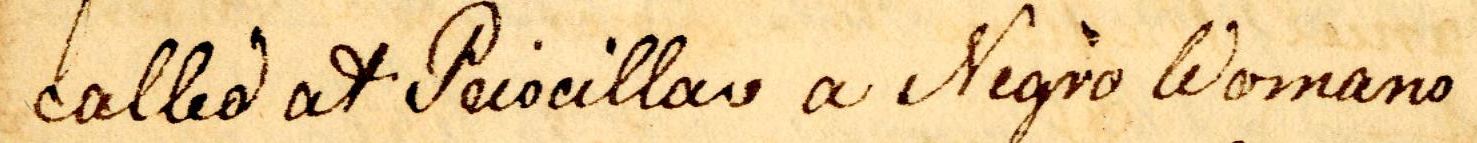called at Priscillas a Negro Womans
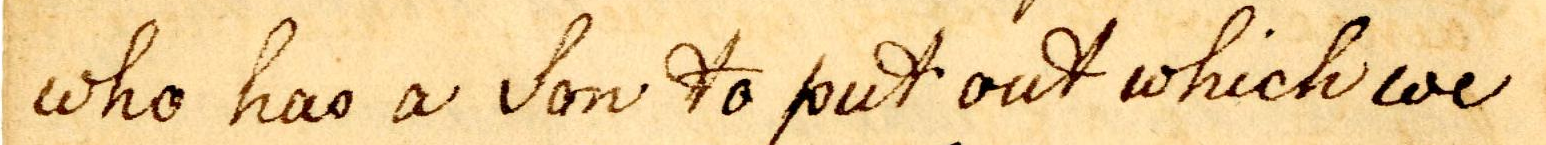who has a Son to put out which we
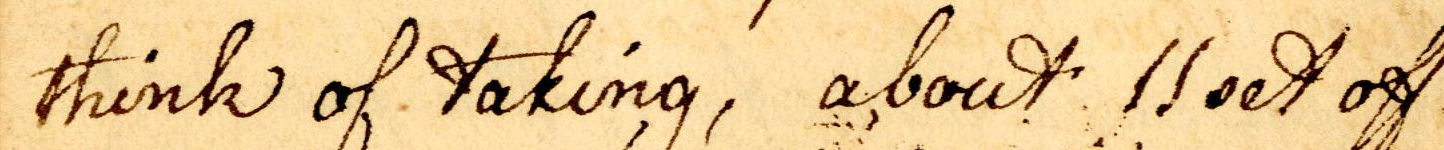think of taking, about 11 set off
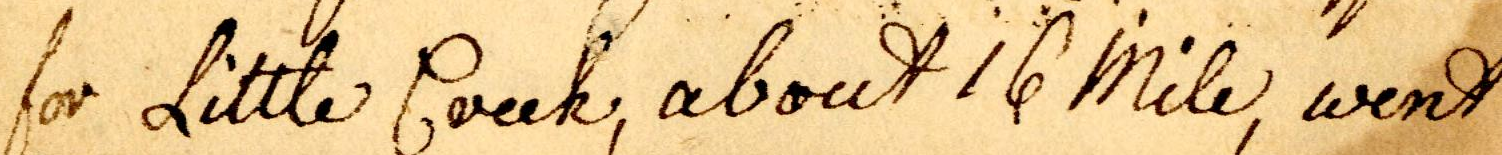for Little Creek, about 16 Mile, went
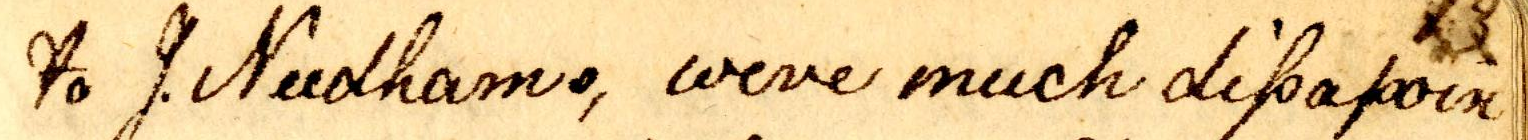to J. Needhams, were much dissapoin
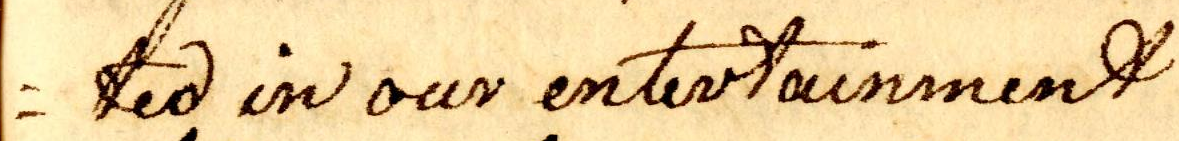-ted in our entertainment
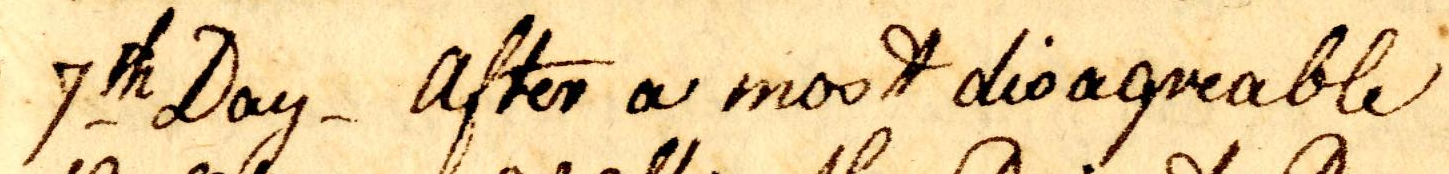7^th Day- After a most disagreable
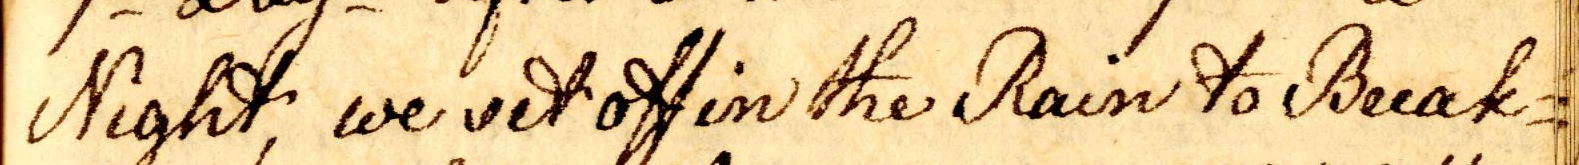Night, we set off in the Rain to Break-
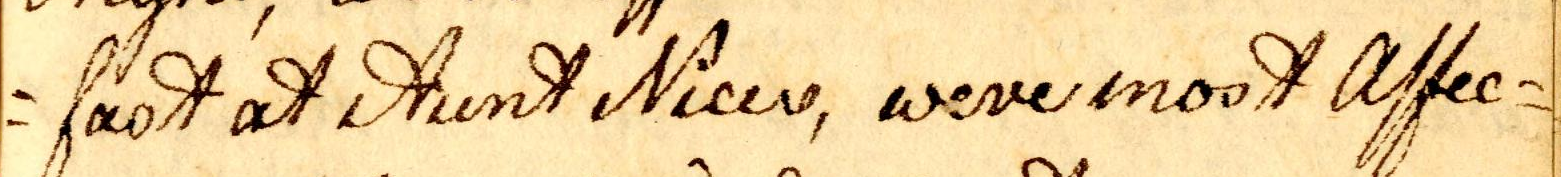-fast at Aunt Nices, were most Affec-
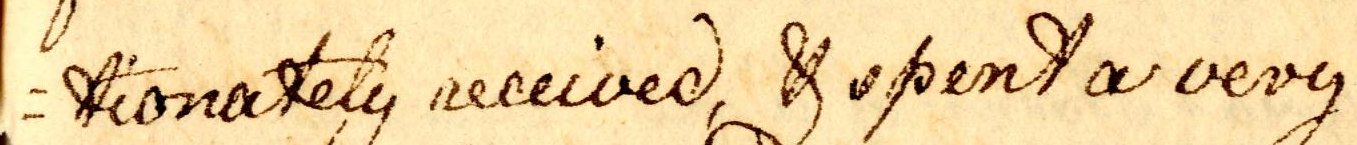-tionately received, & spent a very
